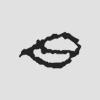日
